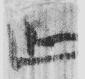亡
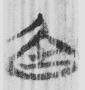卣
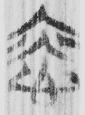恋
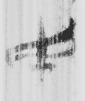民
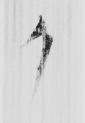人
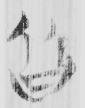皆
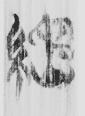{糸矛山}
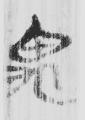禺
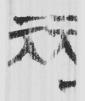{亓亓,元元}
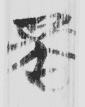{日虫}
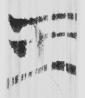王
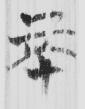不
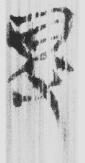𠭁
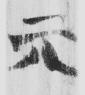亓
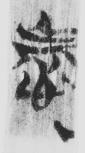𢝬
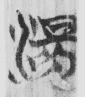湯
